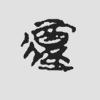復
